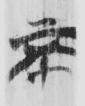不
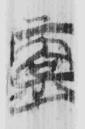{厂盍}
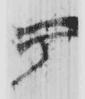于
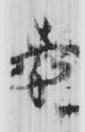志
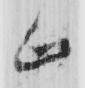㠯（以）
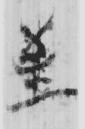至
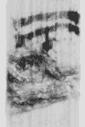于
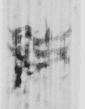邦
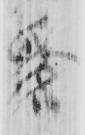{爪家}
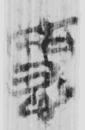{昏耳心}
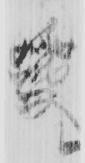亂
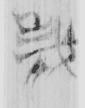{毛戈人}
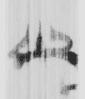少
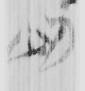{少刀}
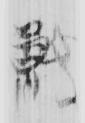{員攴}
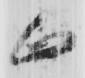㠯（以）
